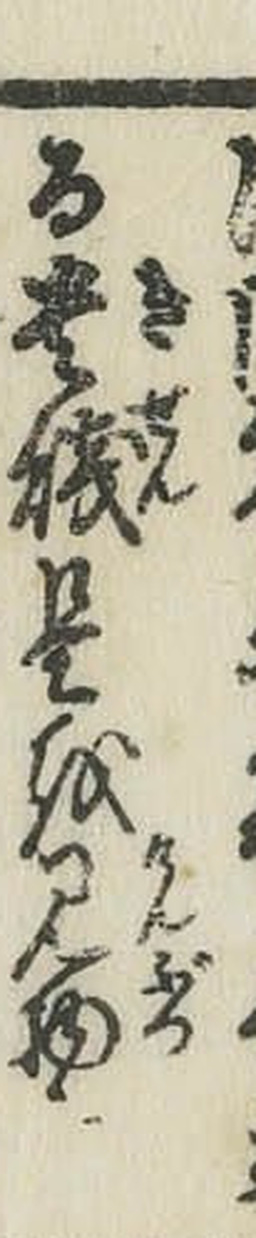る貴賤是を見物
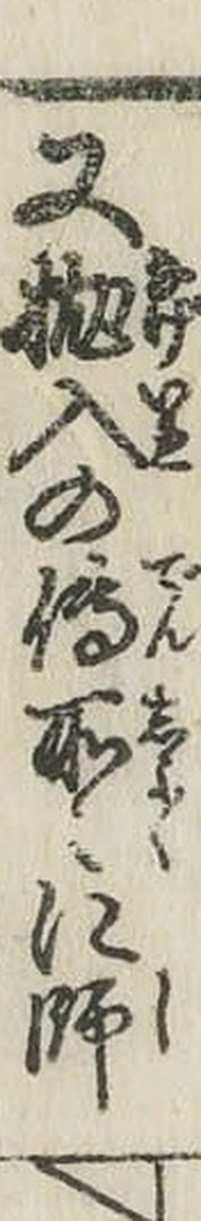又拋入の伝所々に師
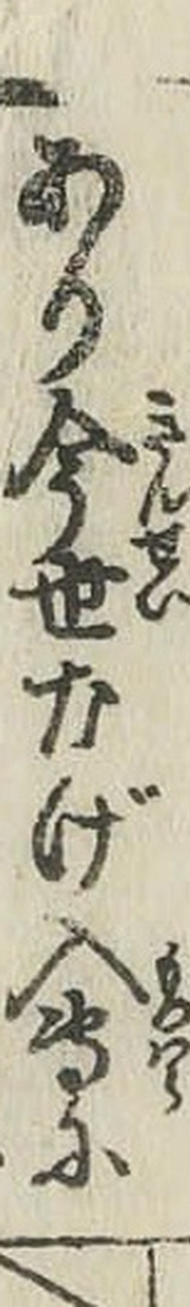あり今世なげ入専に
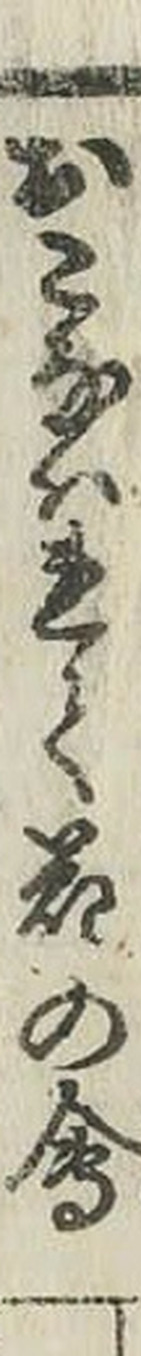おこなはれて花の会
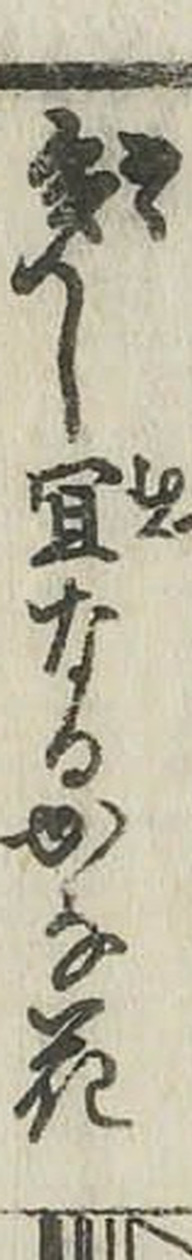多し宜なるかな花
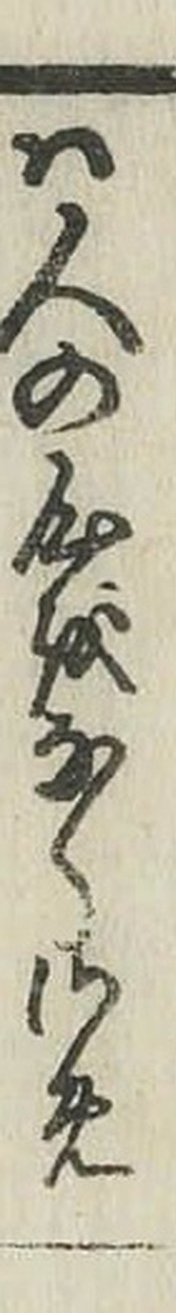は人の心をなくさめ
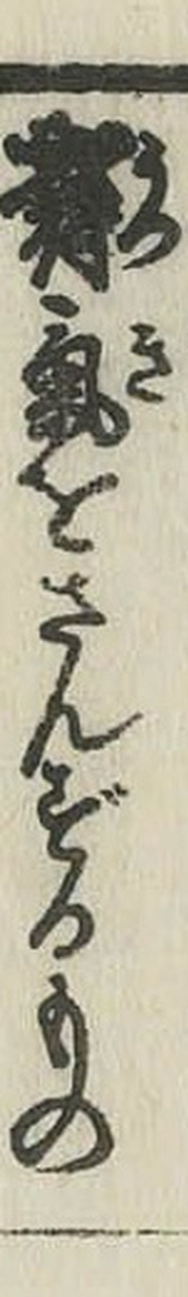鬱気をさんずるもの
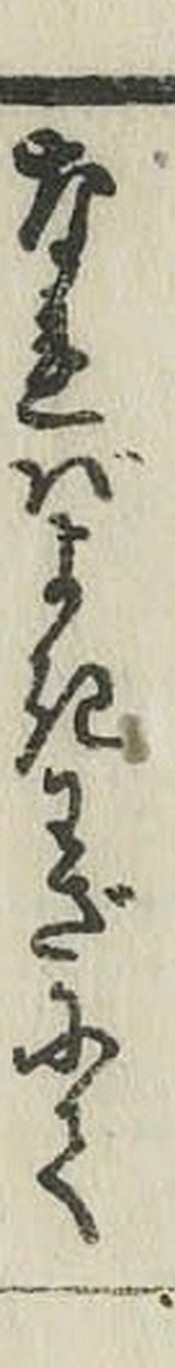なればよきわざにて
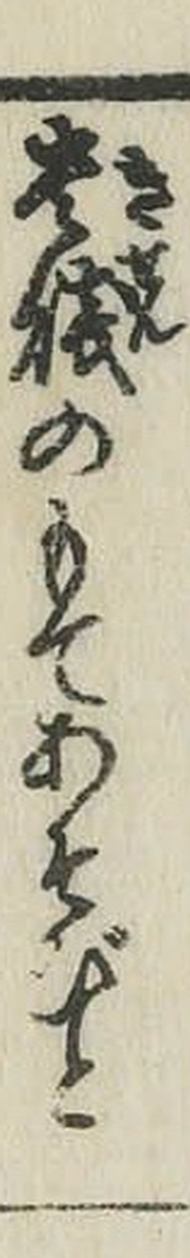貴賤のもてあそびと
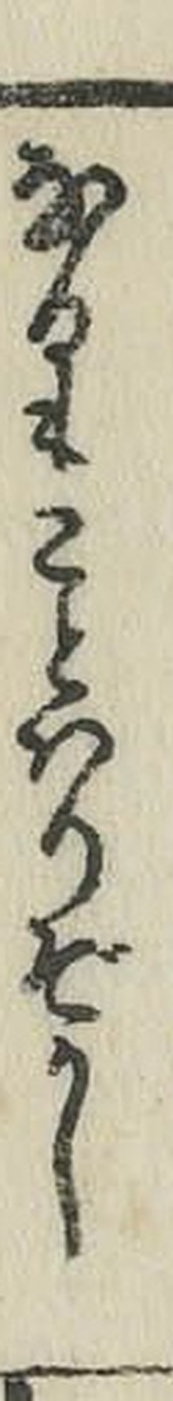なるもことはりぞかし

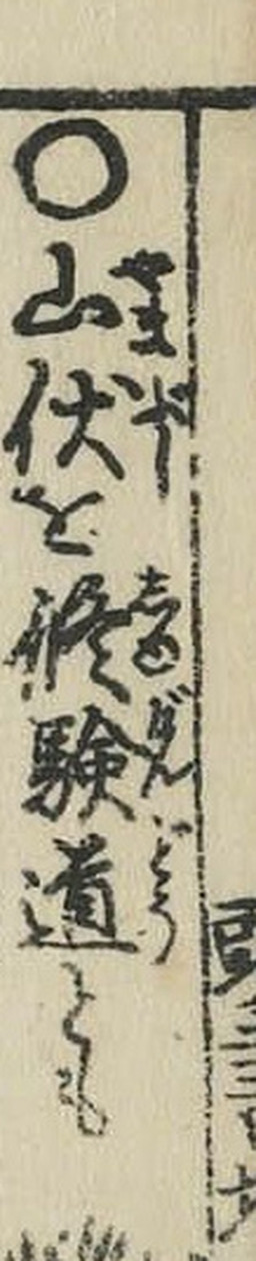○山伏を修験道とも
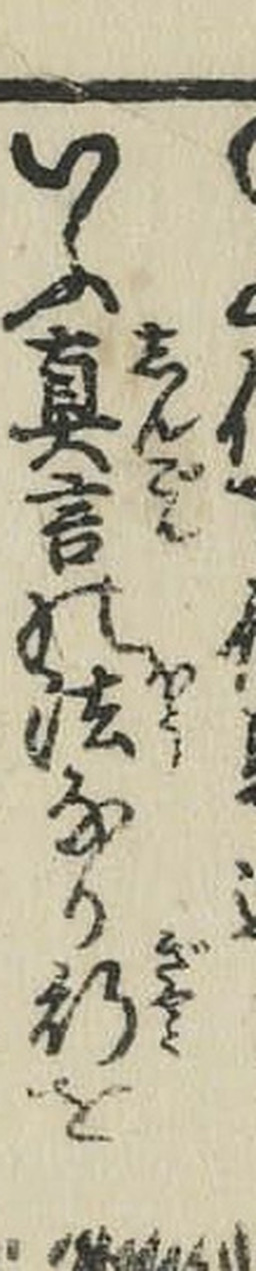いふ真言の法なり行を
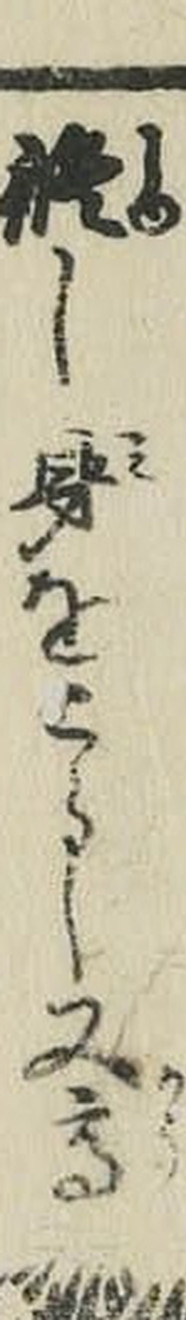修し身をこらし又高
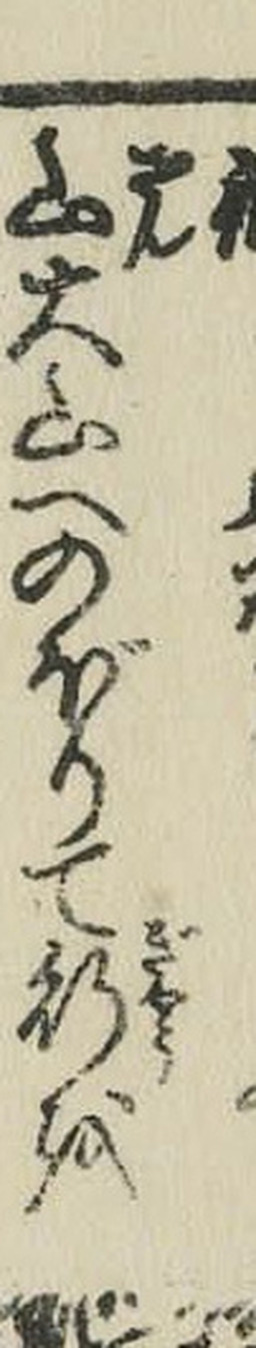山大山へのぼりて行を
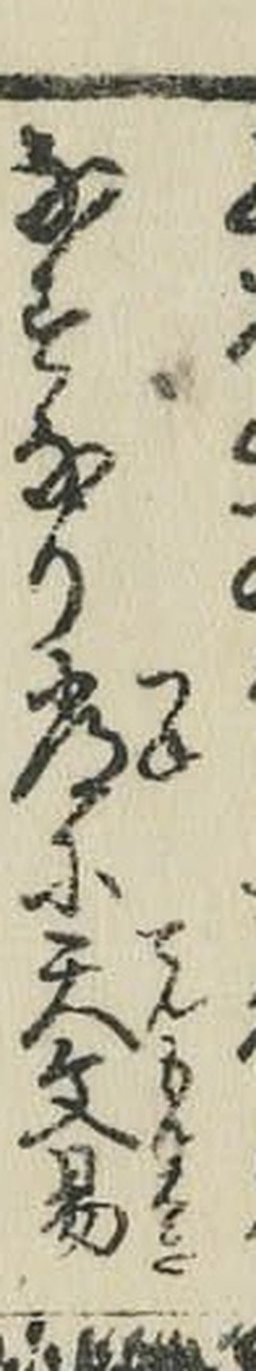なすなり常に天文易
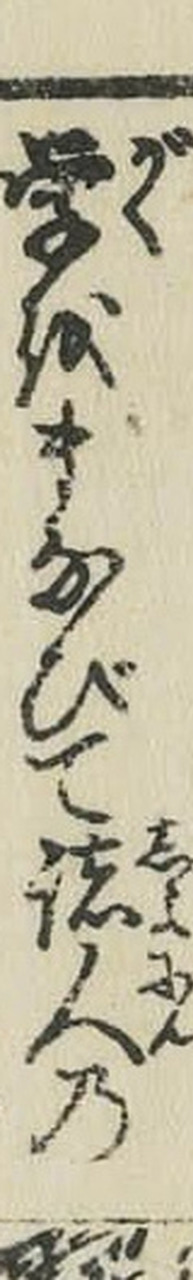学をまなびて諸人の
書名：増補頭書訓蒙図彙大成 10巻 10:巻之21
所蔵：東京学芸大学教育コンテンツアーカイブ
